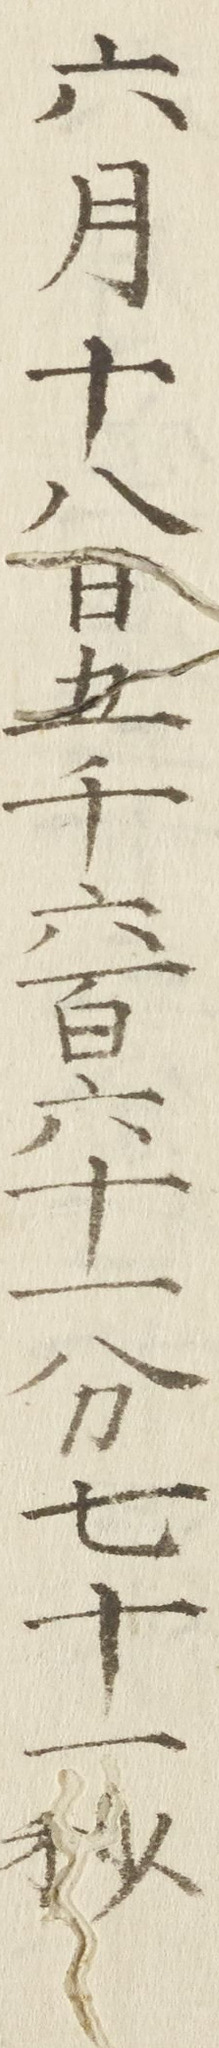六月十八日五千六百六十一分七十一秒
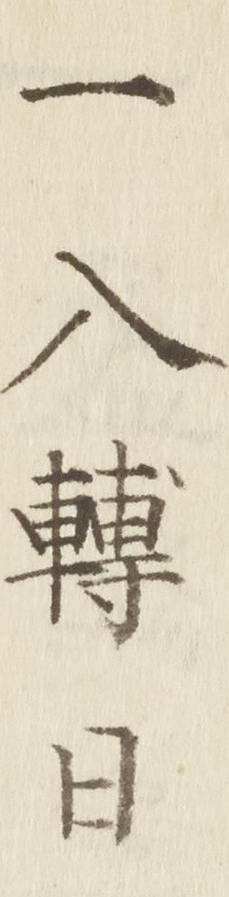一入転日
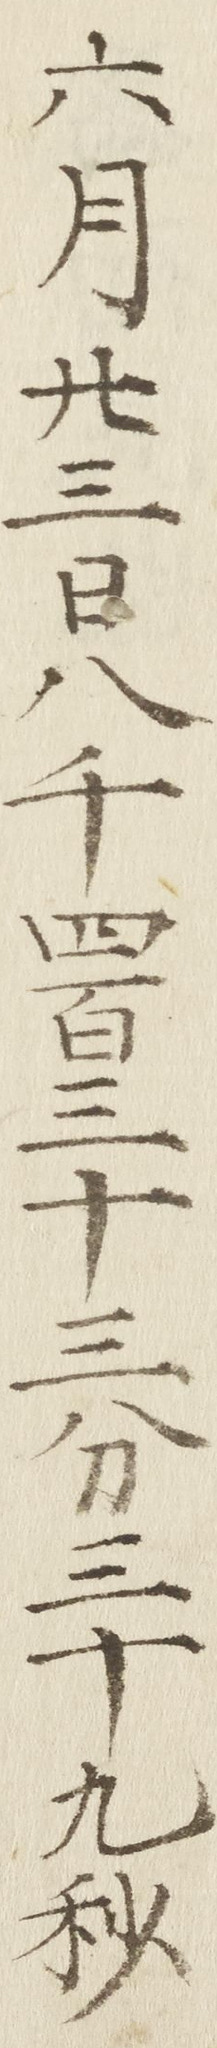六月廿三日八千四百三十三分三十九秒
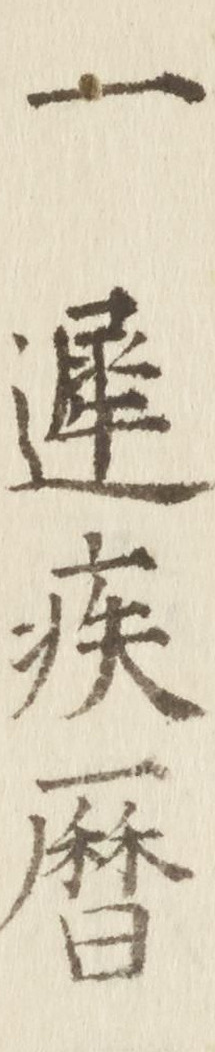一遅疾暦
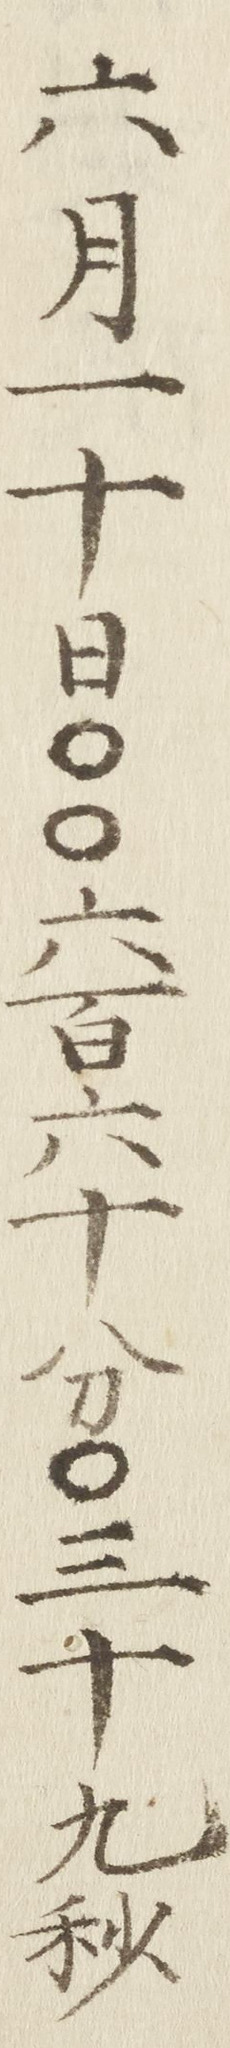六月一十日〇〇六百六十分〇三十九秒
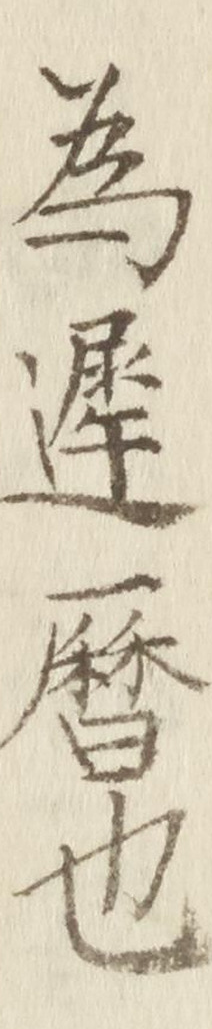為遅暦也
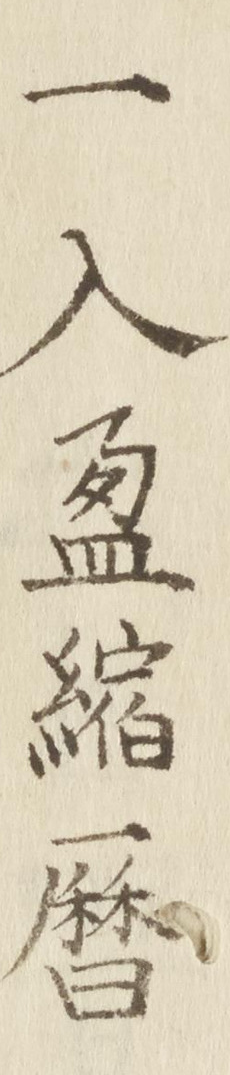一入盈縮暦

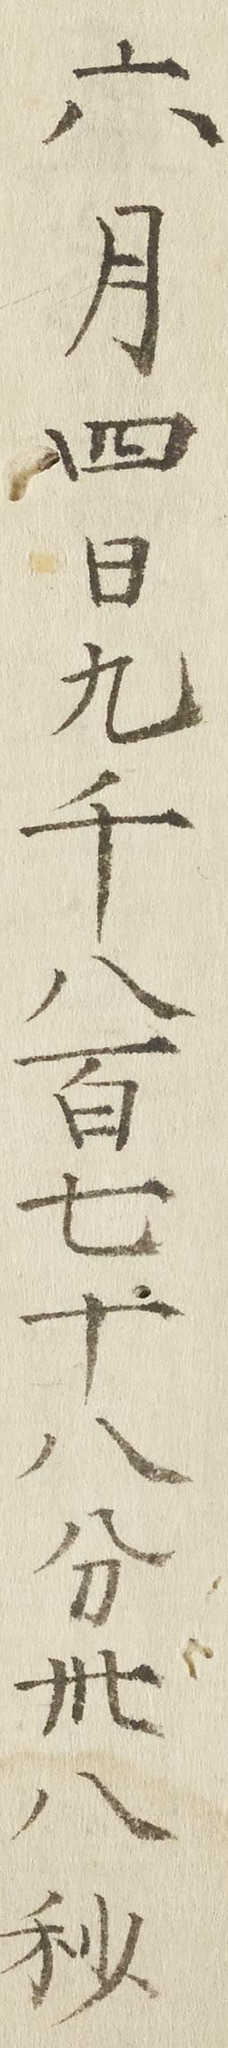六月四日九千八百七十八分卅八秒
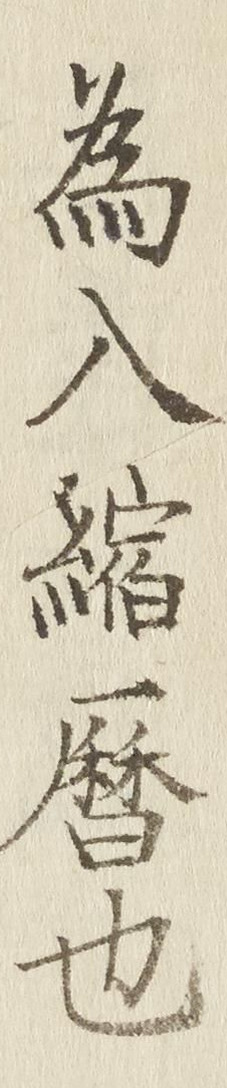為入縮暦也
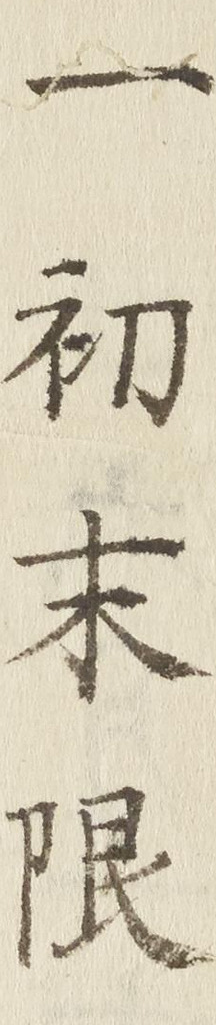一初末限
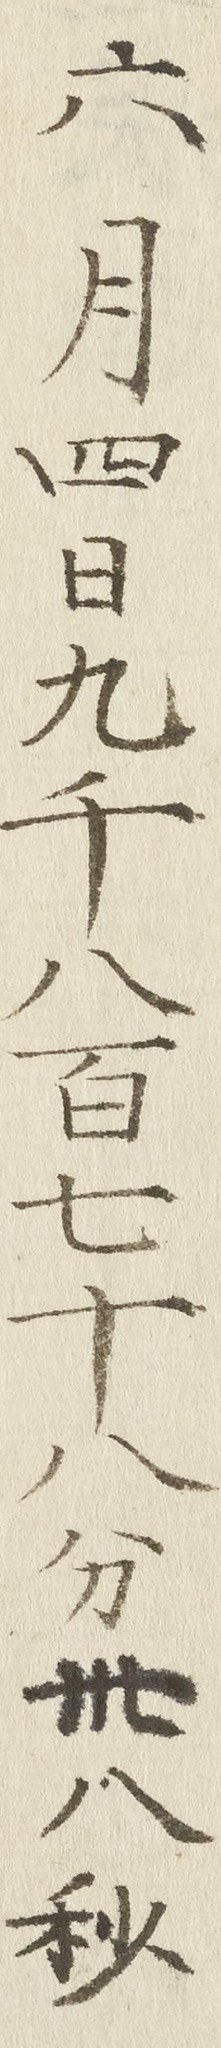六月四日九千八百七十八分卅八秒
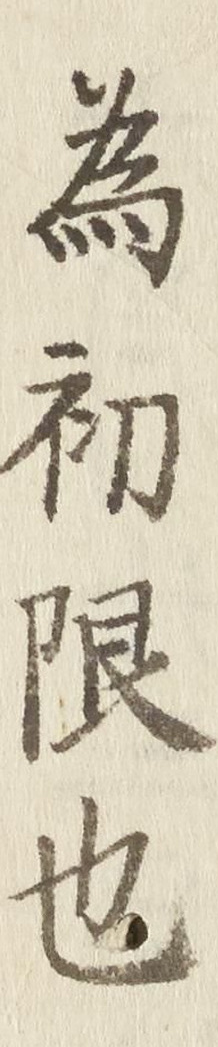為初限也
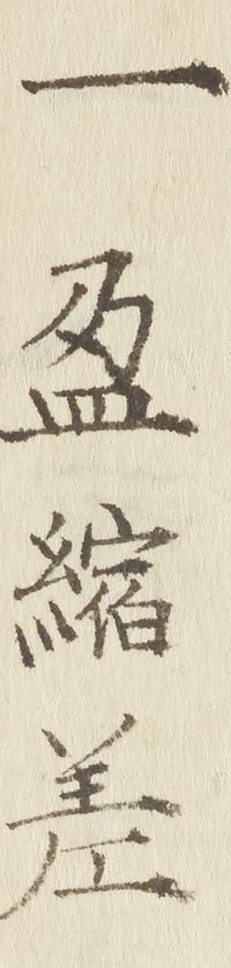一盈縮差
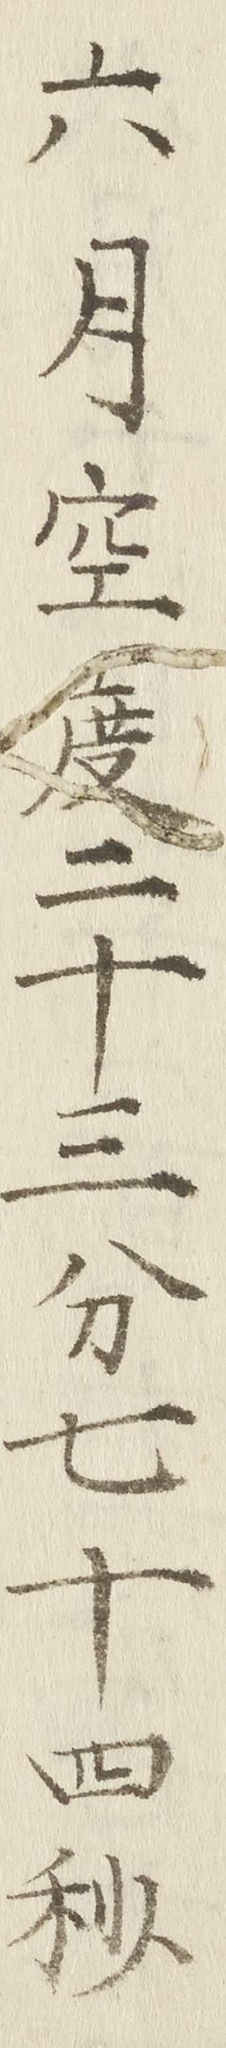六月空度二十三分七十四秒
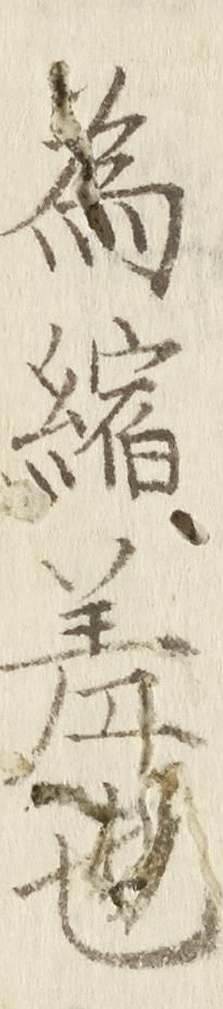為縮差也
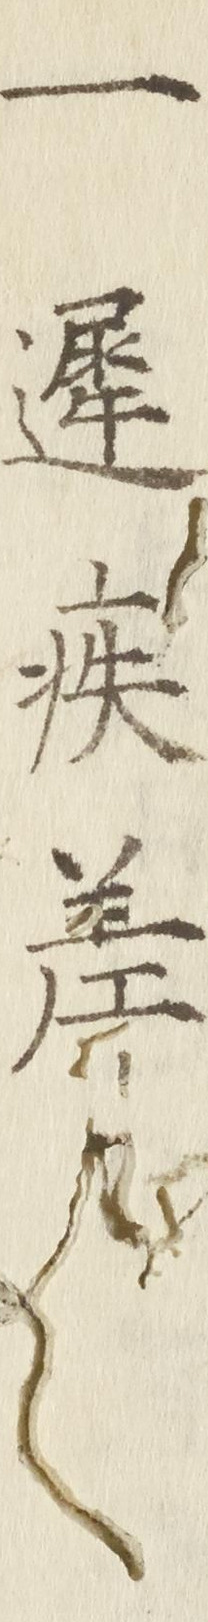一遅疾差
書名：日食度
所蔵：東京大学地震研究所図書室 Earthquake Research Institute Library, The University of Tokyo, JAPAN
